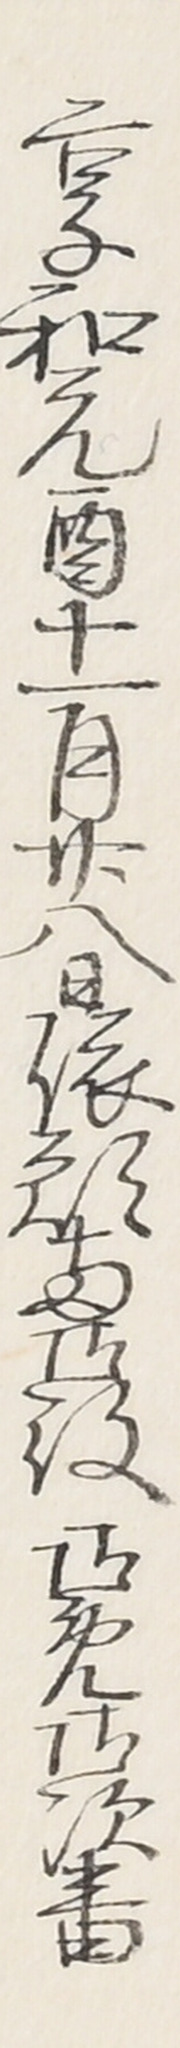一享和元酉十一月廿八日依願両御役御免御次番
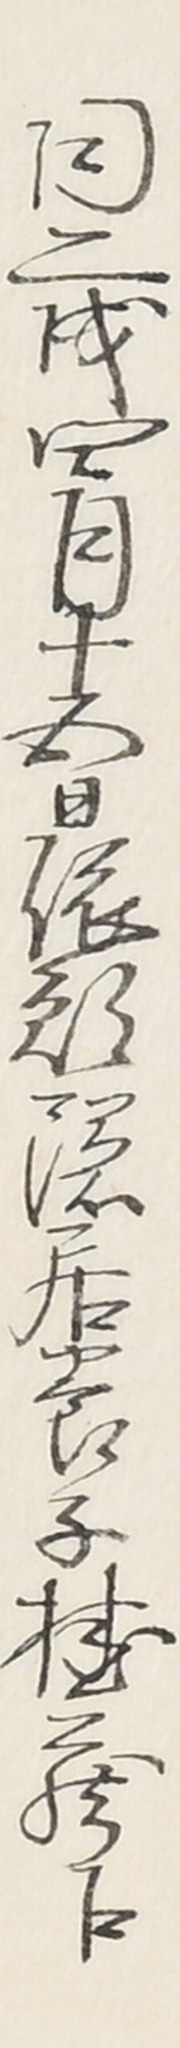一同二戌四月十五日依願隠居養子桂蔵江
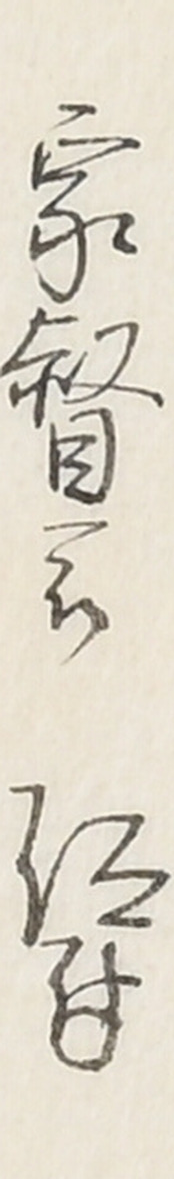家督被仰付
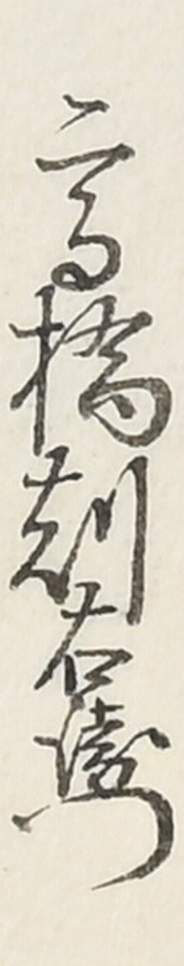高橋刻右衛門
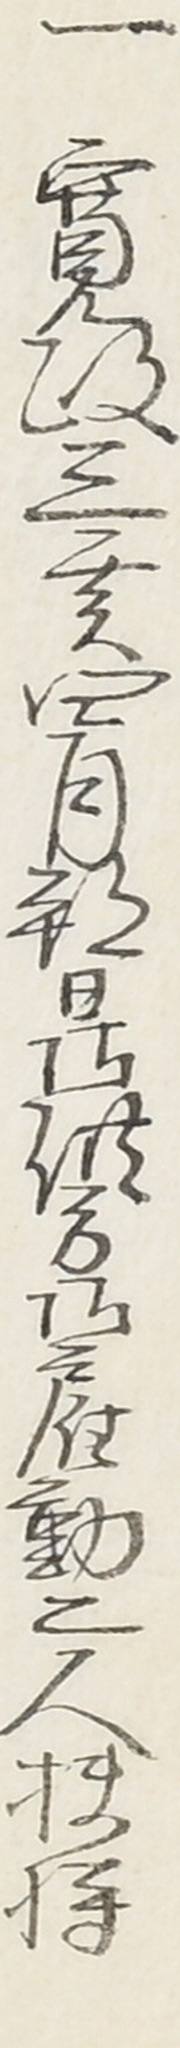一寛政三亥四月朔日御供方雇勤二人扶持
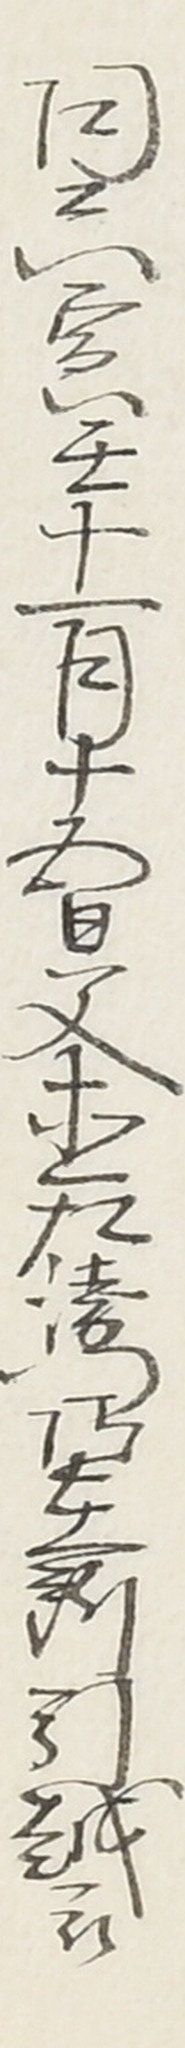一同六寅閏十一月十五日父直左衛門御在所引越被
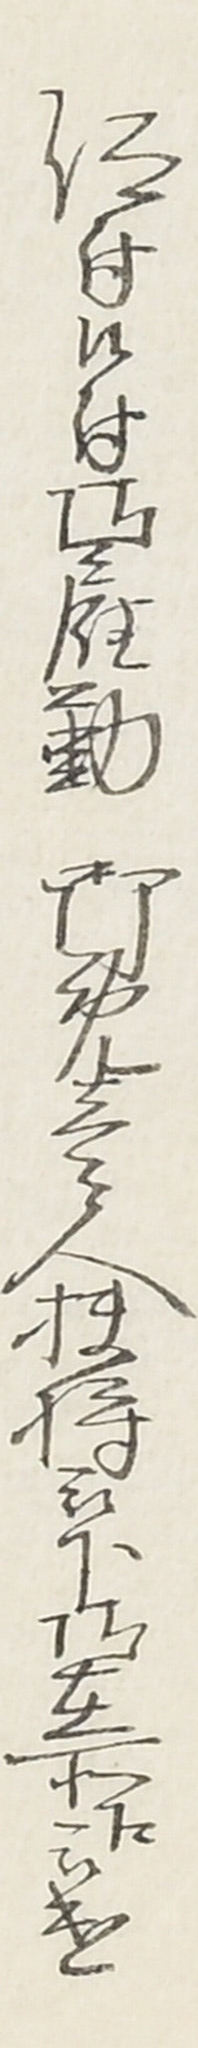仰付候付御雇勤御免壱人扶持被下御在所江被遣
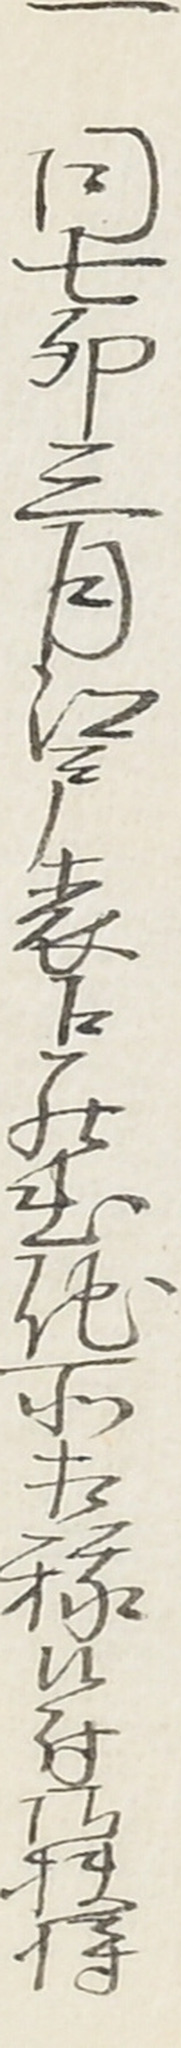一同七卯三月江戸表江罷出他所相稼候付御扶持
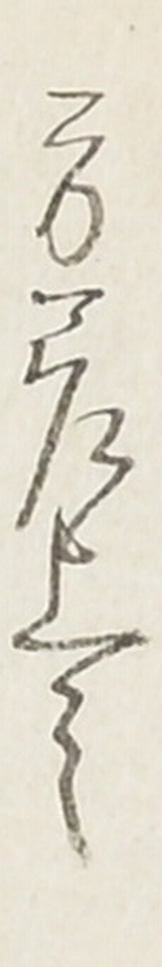方差上候
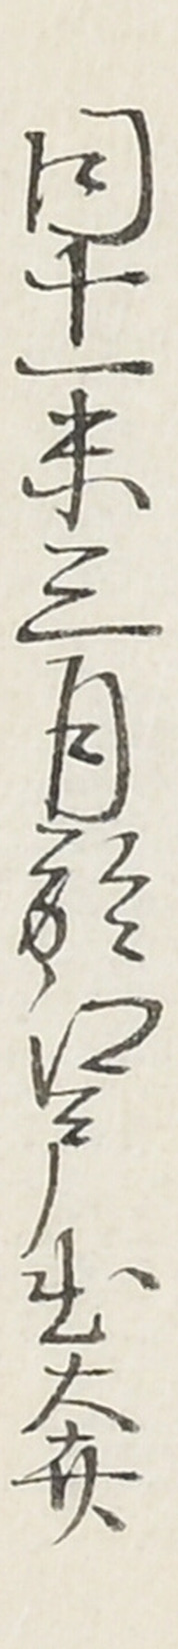一同十一月未三月於江戸出奔
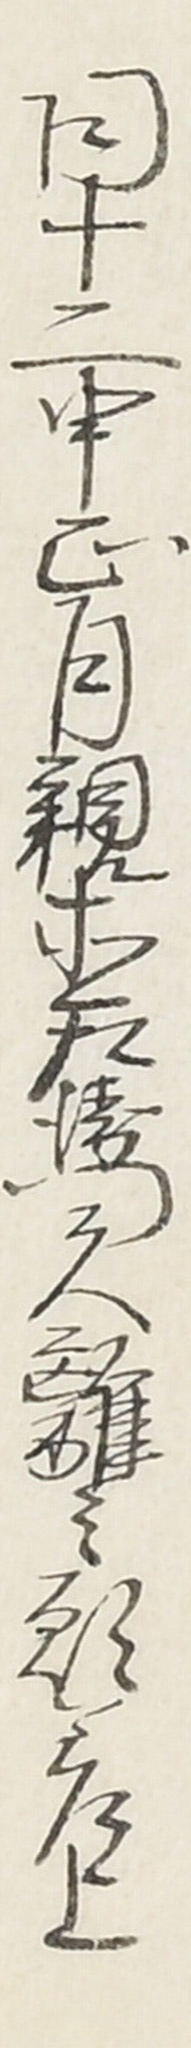一同十二申正月親直左衛門久離之願差上
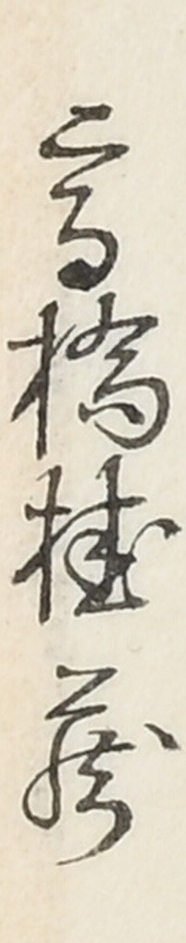高橋桂蔵

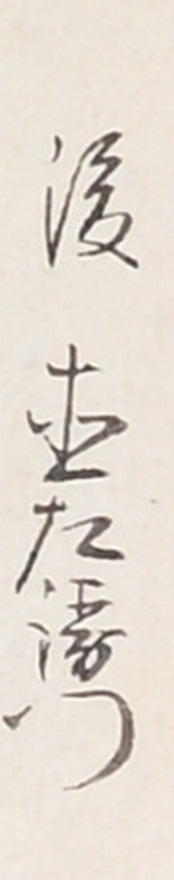後直左衛門
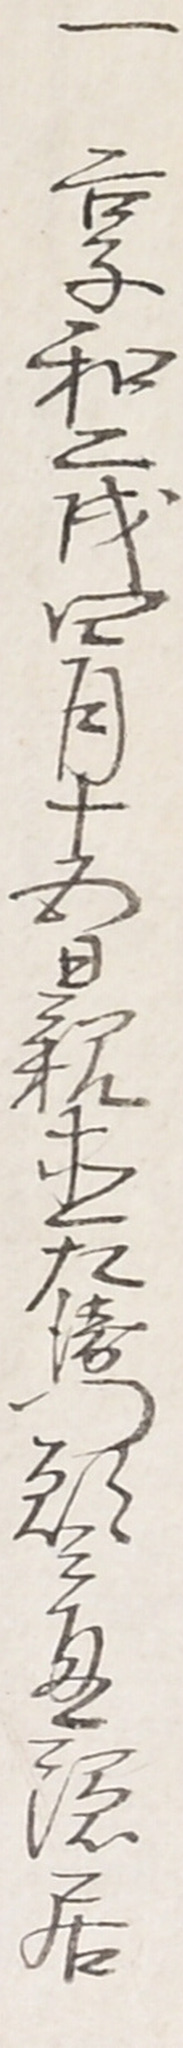一享和二戌四月十五日親直左衛門願之通隠居
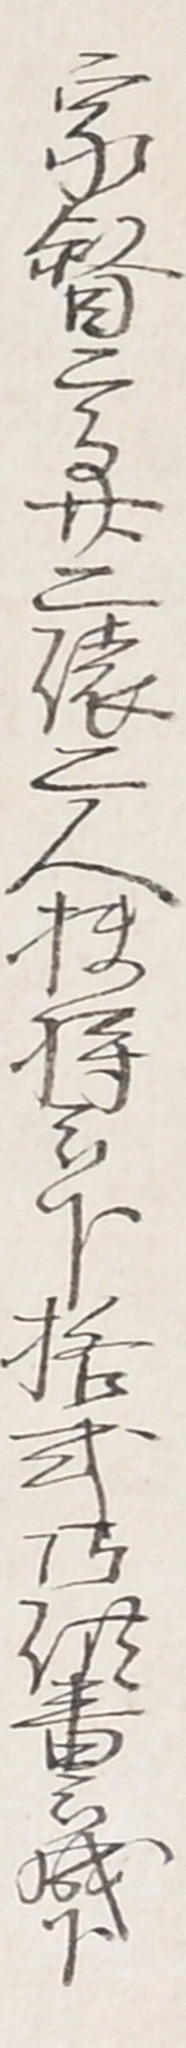家督高廿二俵二人扶持被下格式御供被成下
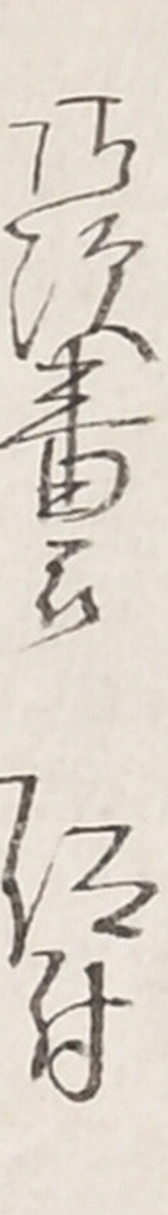御次番被仰付
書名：無足諸士勤仕録（四）
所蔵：伊那市立高遠町図書館・合同会社AMANE
